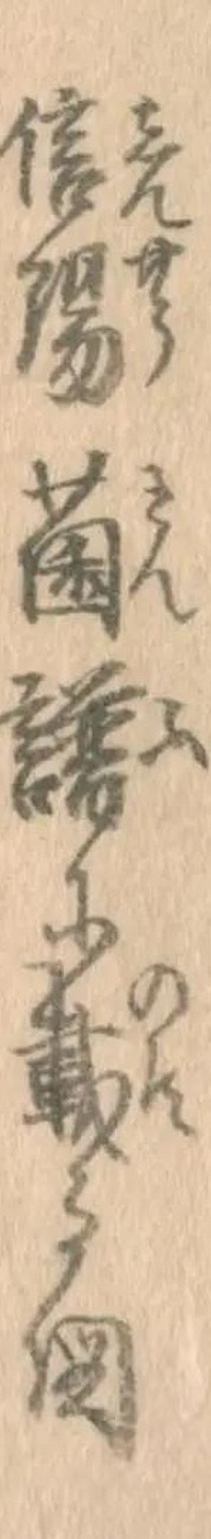信陽菌譜に載る図
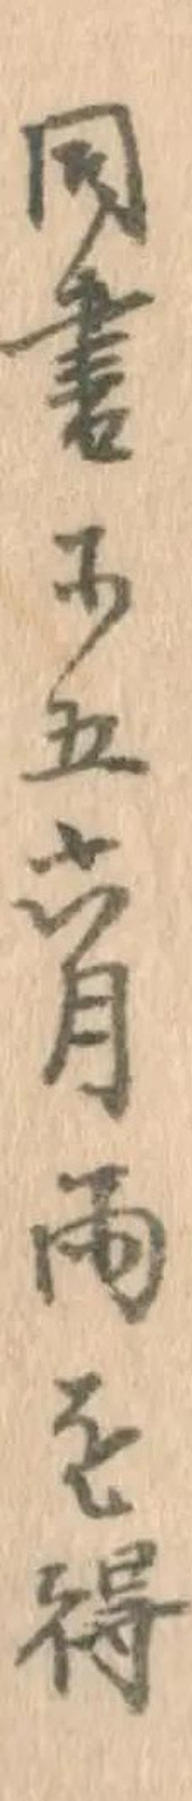同書に五六月雨を得
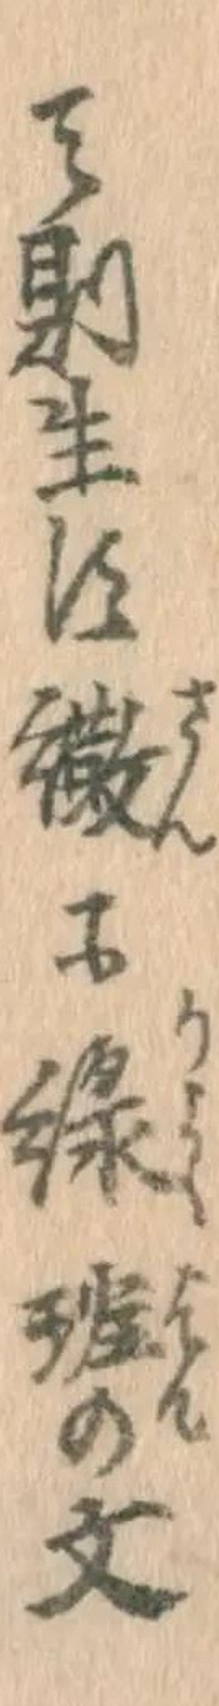て則生す繖に緑斑の文
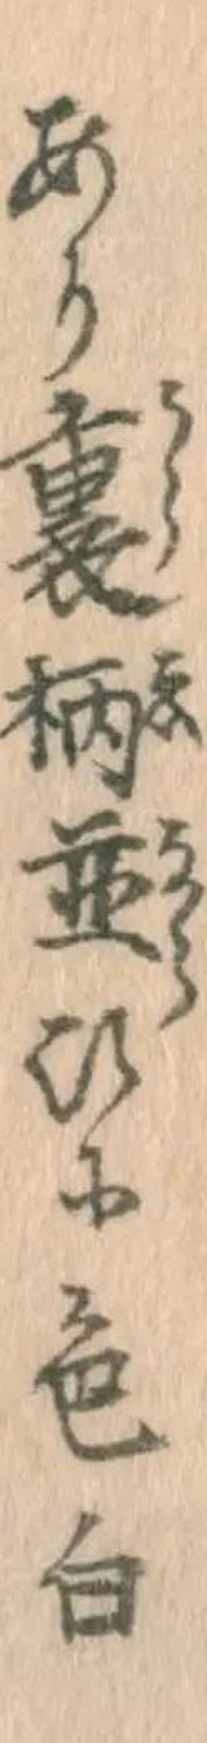あり裏柄並ひに色白
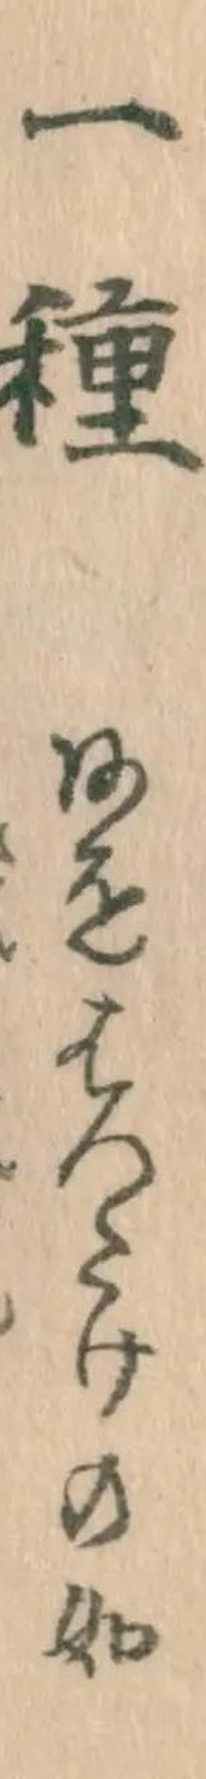一種あをはつたけの如
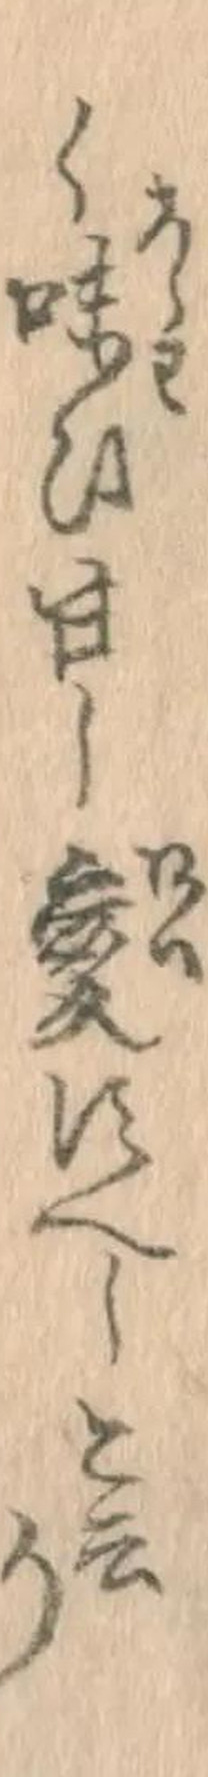く味ひ甘し愛すへしと云う
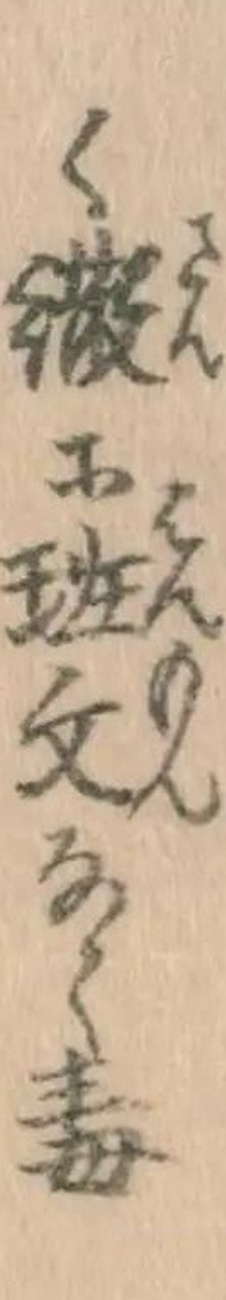く繖に斑文なく毒
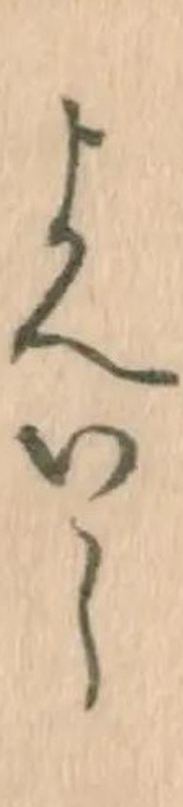よへいし
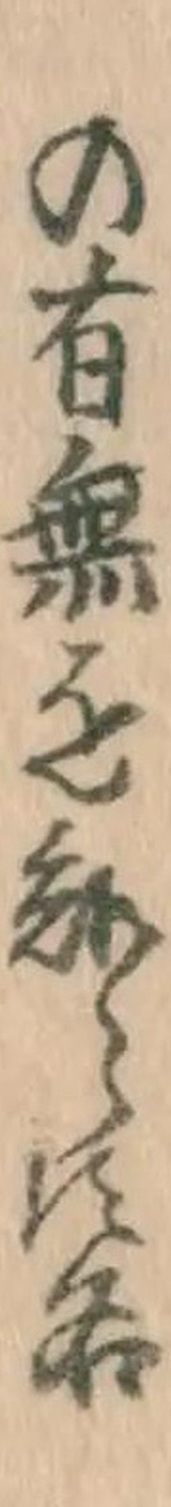の有無を知らす名
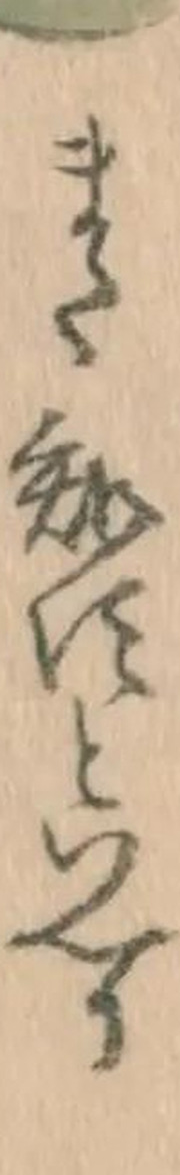また知すといへり
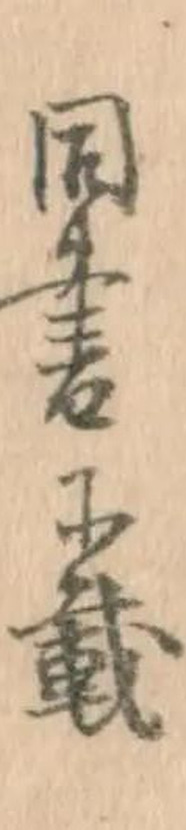同書に載
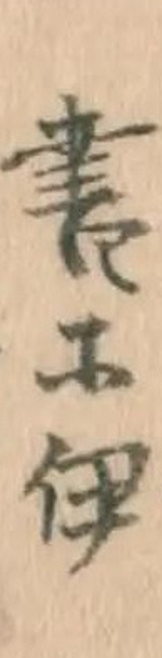書に伊
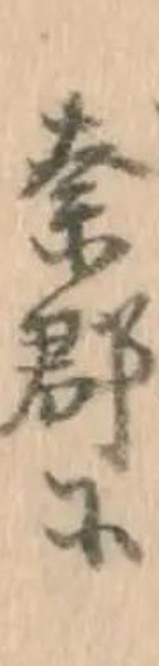奈郡に
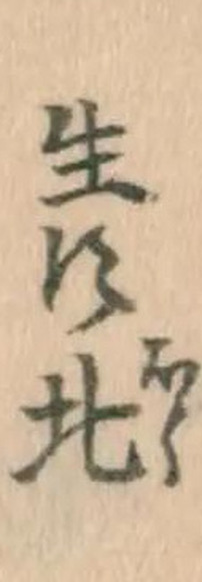生す北
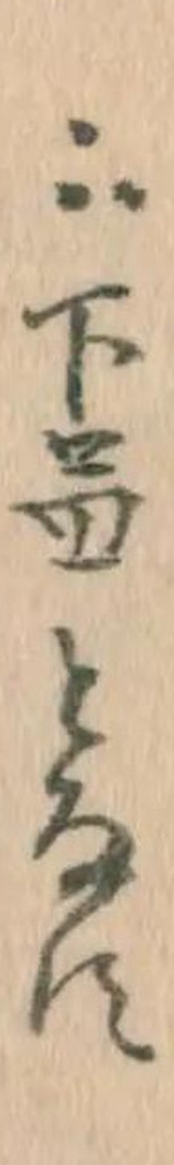∴下品となす
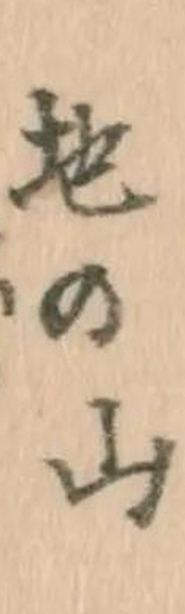地の山
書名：本草図譜. 巻55-57
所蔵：国立国会図書館 National Diet Library, JAPAN
